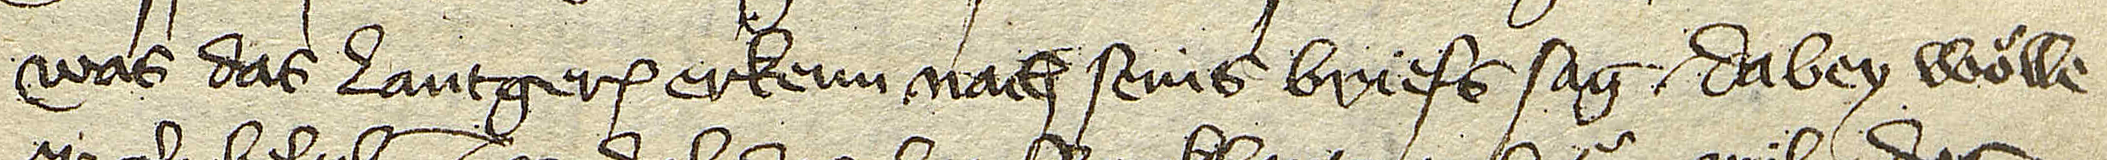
was das Lantger* erkenn nach ſeins briefs ſag / dabey wölle
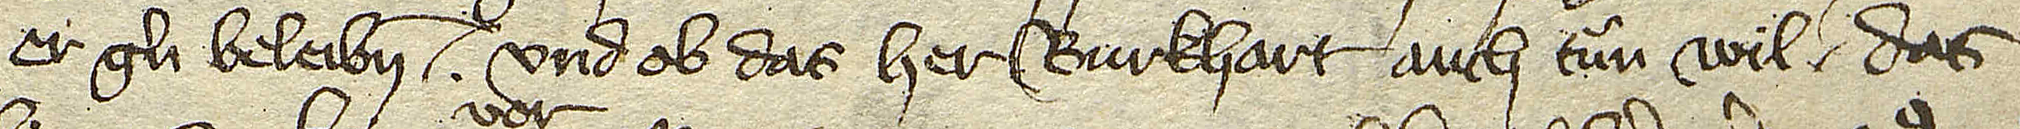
er g*n beleibn* / . vnd ob das her Burkhart auch tün wil / das
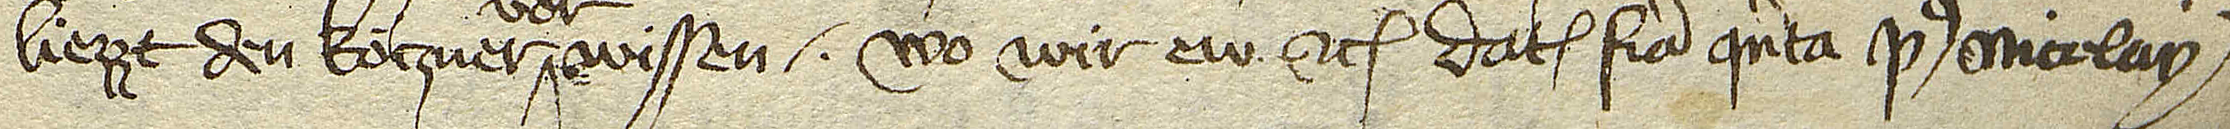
lieʒʒt den köcʒner wiſſen / . wo wir ew ec* dat* fia* qrta* p* Nicolay
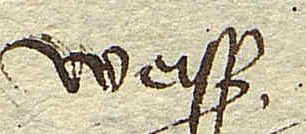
weiſſ*.
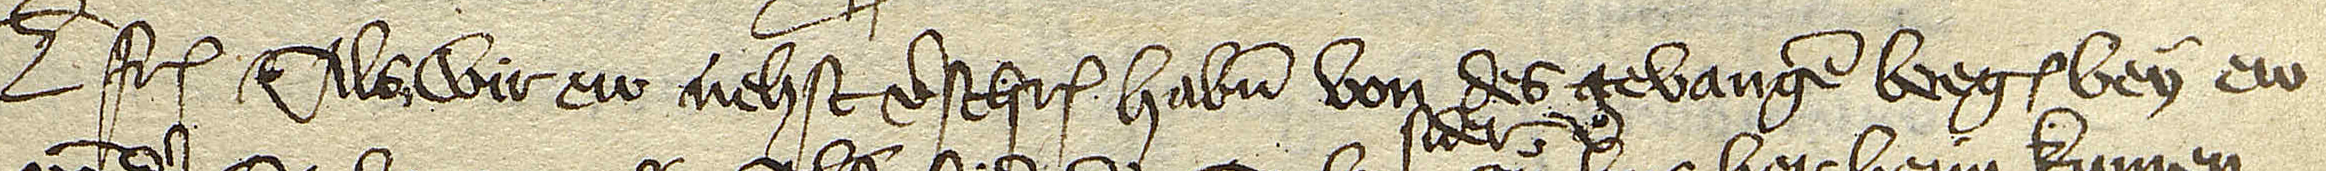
L* fr* / Als wir ew nehſt v*ſchr* habn* von des gevange* weg* bey ew
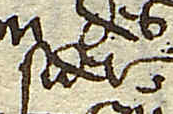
ſider
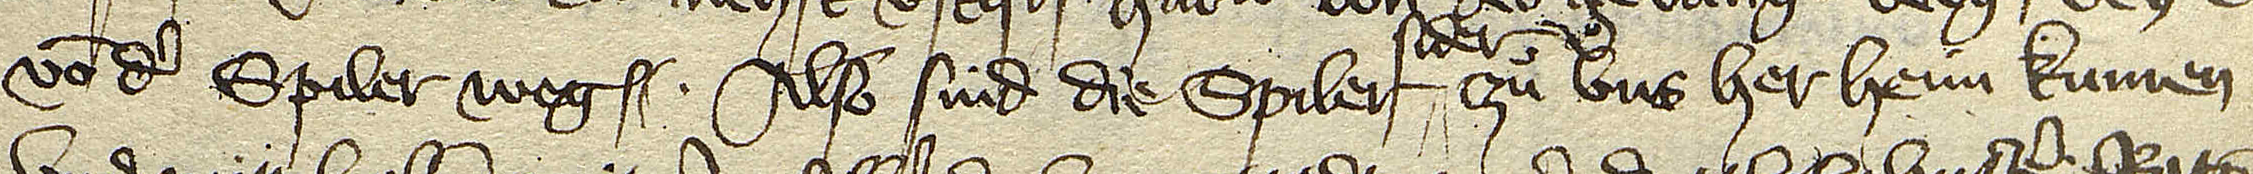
vo* d* Spiler weg* / . Alſo ſind die Spiler cʒü vns her heim kumen
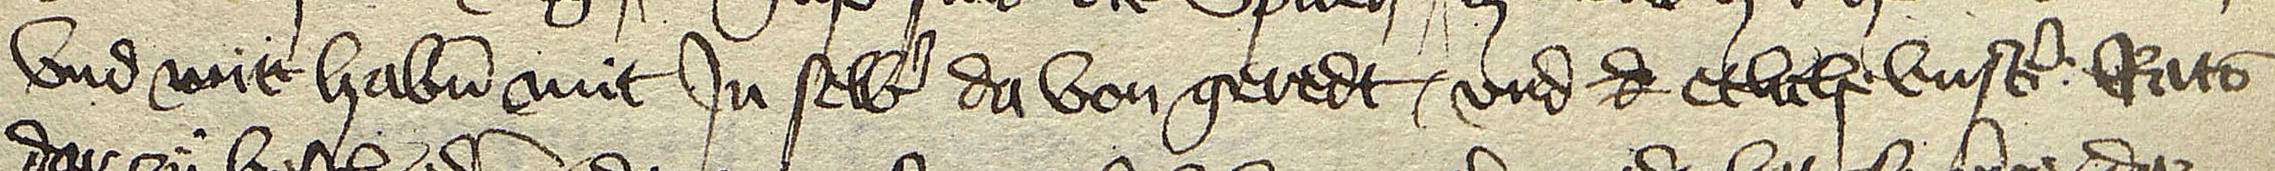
vnd wir habn* mit In ſelb* da von geredt / vnd d etliche vnſs* Rats
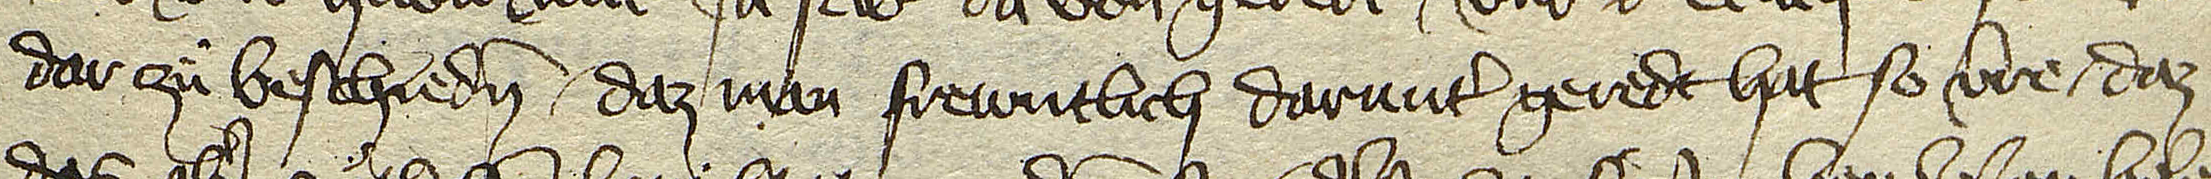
dar cʒü beſchiedn* / daʒ man frewntlich darunt* geredt hat ſo v*re / daʒ
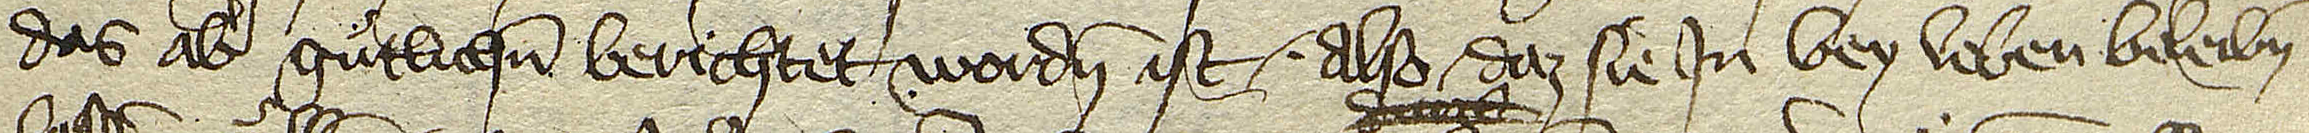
das ab* gütlichn* berichtet wordn* iſt / . Alſo / daʒ ſie In bey leben beleibn*
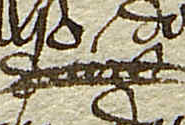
d%%%%%
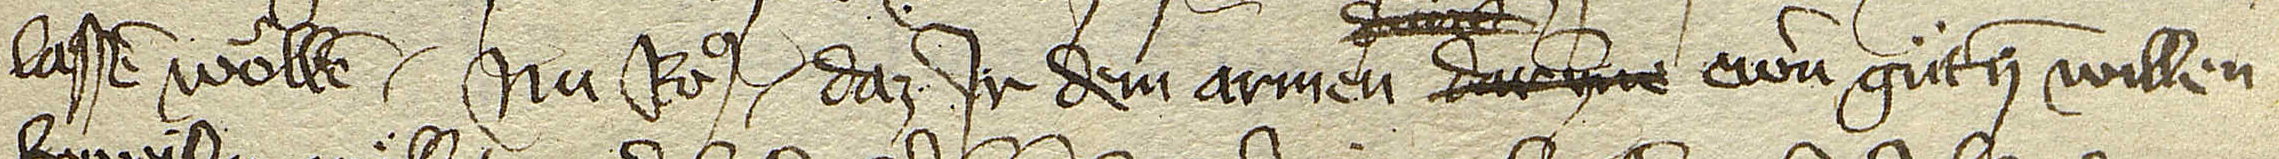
laſſe* wölle* / Nu Ro* / daʒ Ir dem armen daryne* ewn* gütn* willen
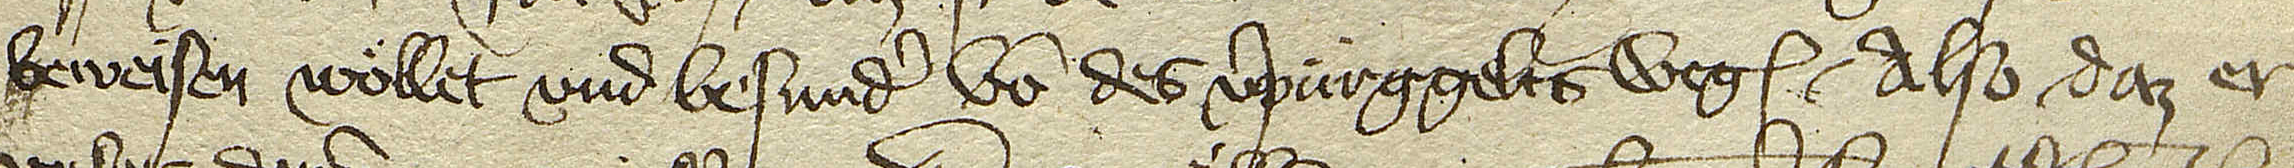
beweiſen wöllet vnd beſund* vo* des v*pürggelts weg* / Alſo / daʒ er
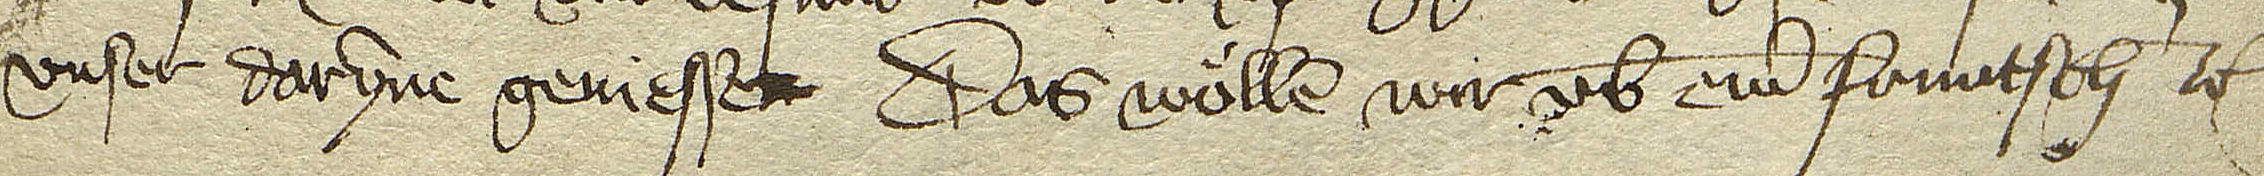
vnſer daryne* genieſſen Das wölle* wir vb* ew* fruntſch* ec*
